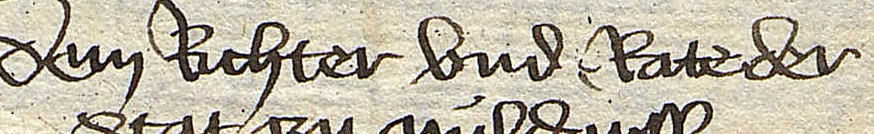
Dem Richter vnd Rate der
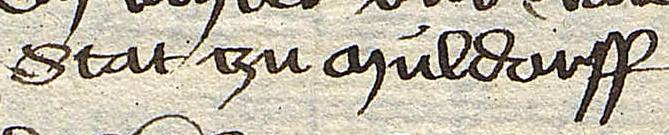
Stat cʒu Müldorff
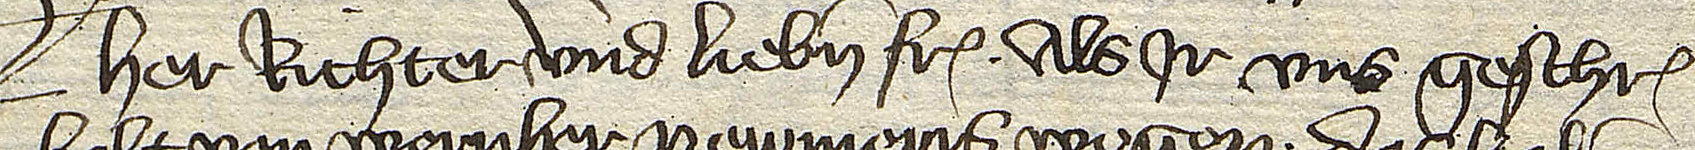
L* her Richter / Vnd liebn* fr* . Als Ir vns geſchr*
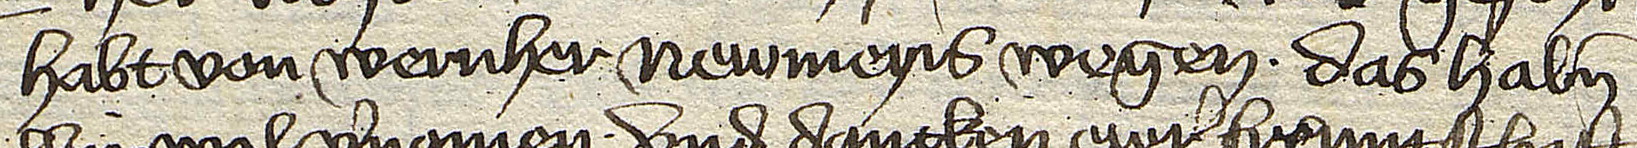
habt von wernher Newmeyrs wegen . das habn*
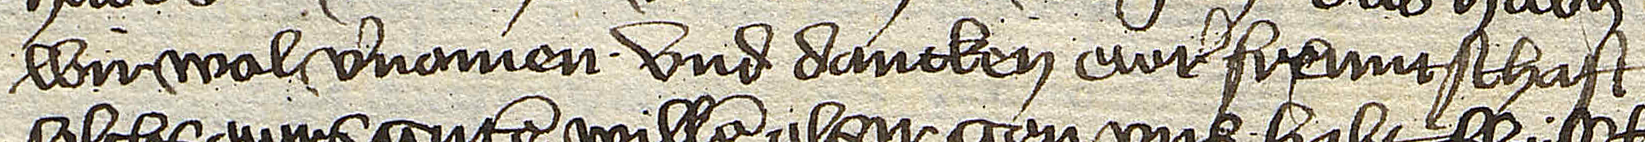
wir wol v*nomen . vnd dancken ewr* freuntſchaft
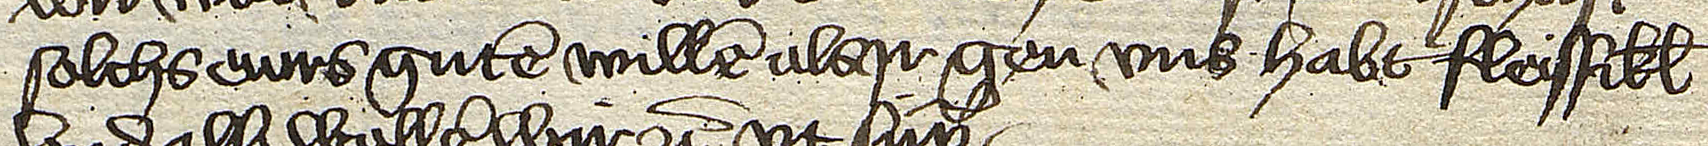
ſolchs ewrs gute* wille* als Ir gen vns habt fleiſſikl*
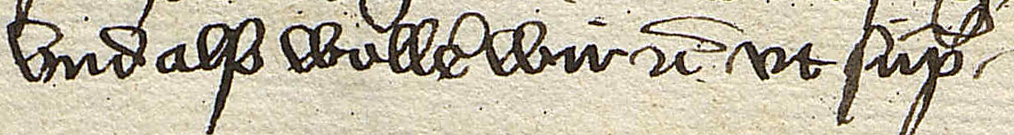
vnd alſo wölle* wir ec* vt ſup* /
